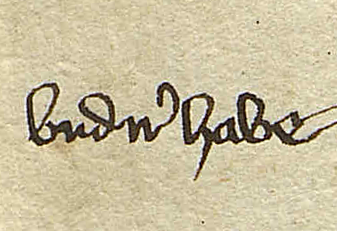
vnd ir* habe
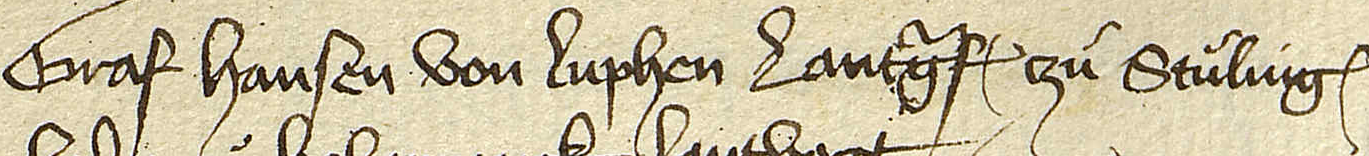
Graf hanſen von luphen Lantg*f cʒü Stüling*
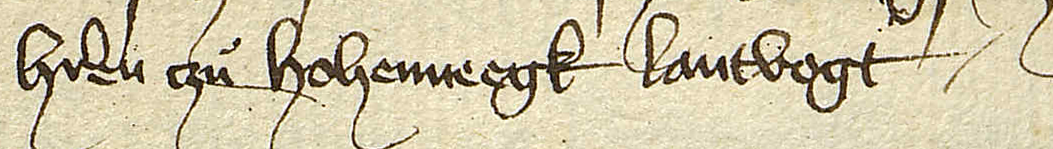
hr*en cʒü hohenneegk lantvogt /
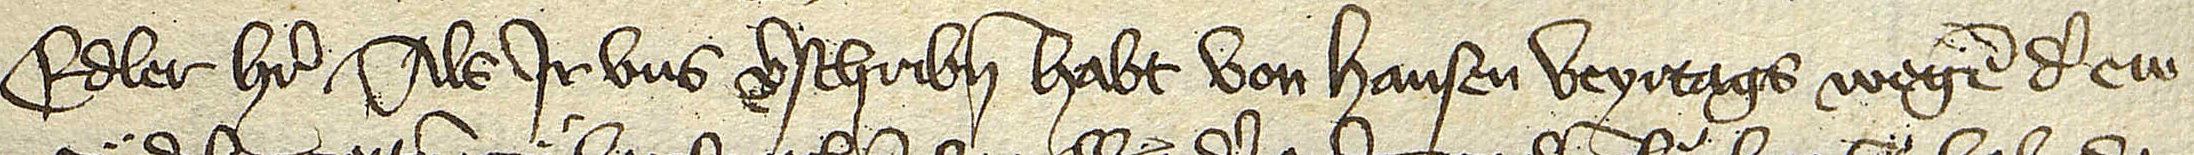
Edler hr* / Als Ir vns v*ſchribn* habt von hanſen Veyrtags wege* d* ew
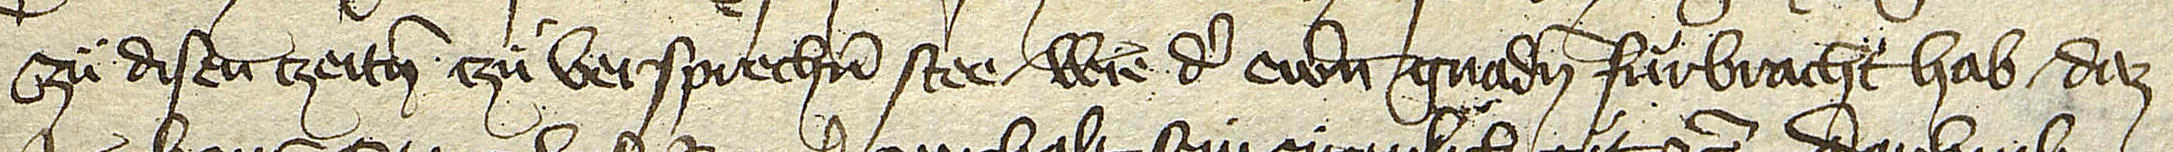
cʒü diſen cʒeitn* cʒü verſprechn* ſtee / wie d* ew*n gnadn* fürbracht hab / daʒ
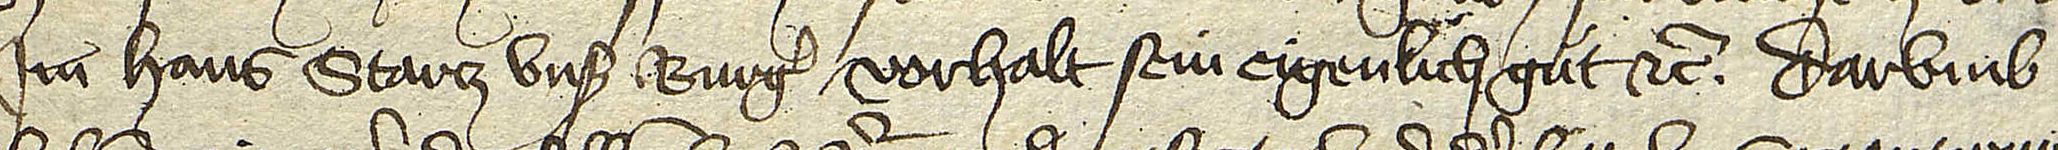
Im hans Starcʒ vnſ* Burg* / vorhalt ſein eigenlich güt ec* . Darvmb
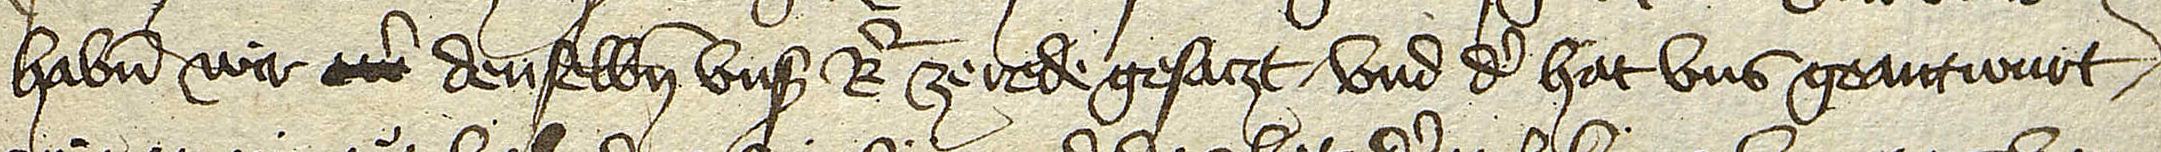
habn* wir ew* denſelbn* vnſ* B* cʒerede geſacʒt / vnd d* hat vns geantwurt /
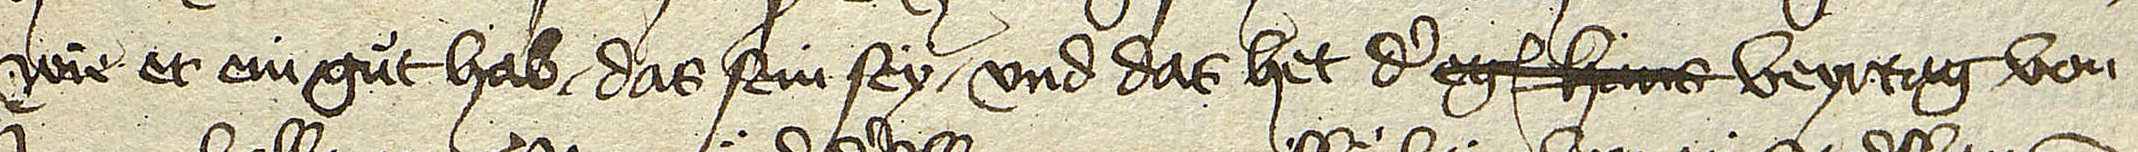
wie er ein güt hab / das ſein ſey / vnd das het d* eg* hans Veyrtag von
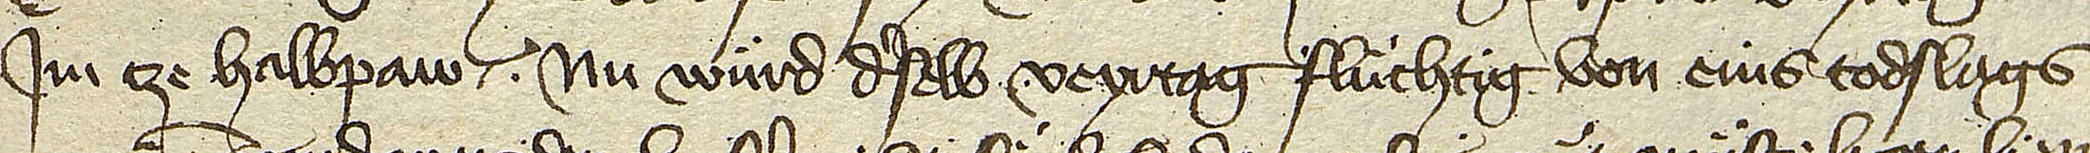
Im cʒe halbpaw / . Nu würd d*ſelb veyrtag flüchtig von eins todſlags
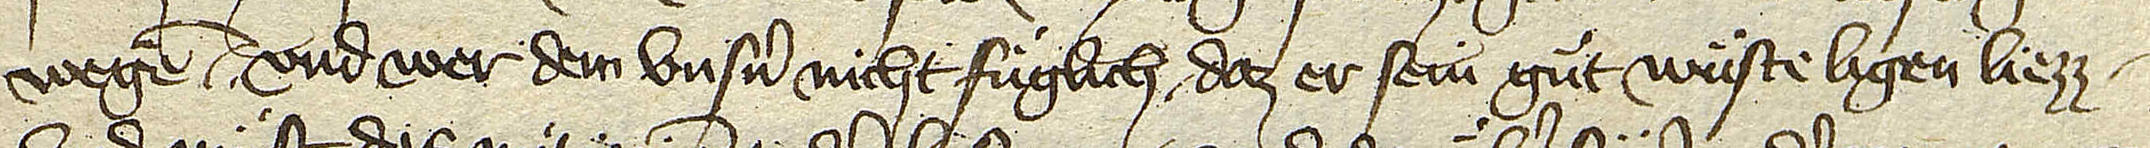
wege* / . vnd wer dem vnſn* nicht füglich / daʒ er ſein güt wüſte ligen lieʒʒ /
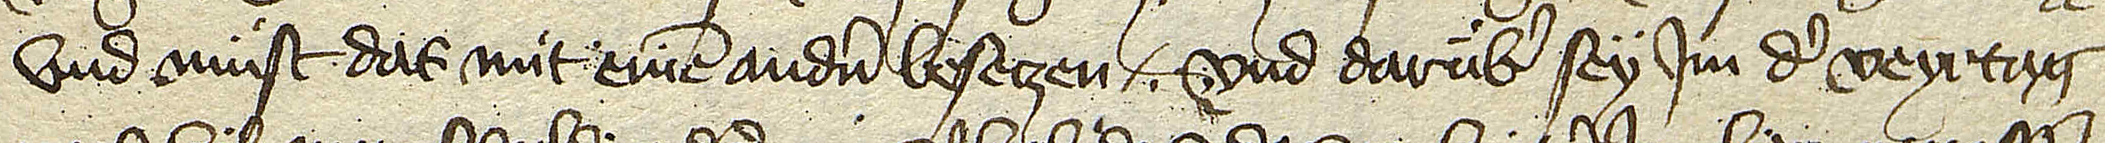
vnd müſt das mit eine* andn* beſecʒen / . vnd darüb* sey Im d* veyrtag
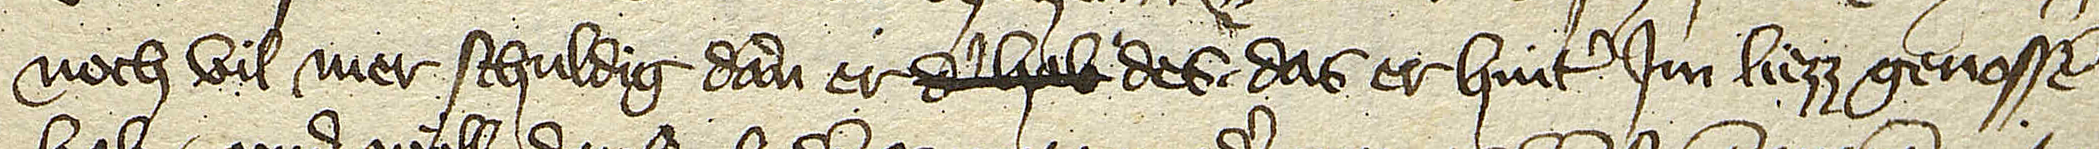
noch vil mer ſchuldig da*n er d* hab des / das er hint* Im lieʒʒ genoſſe*
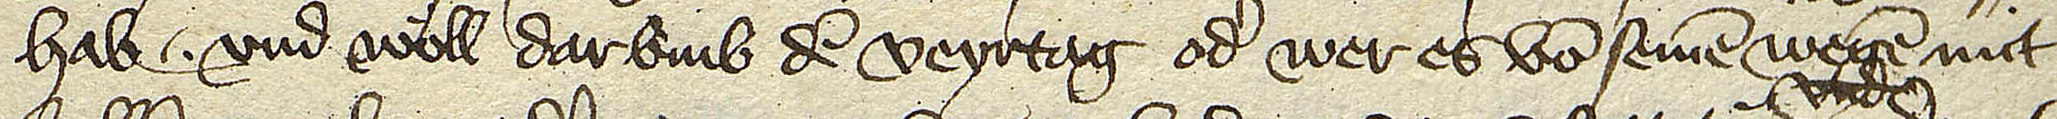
hab / . vnd wöll darvmb d* veyrtag od* wer es vo* ſeine* wege* mit
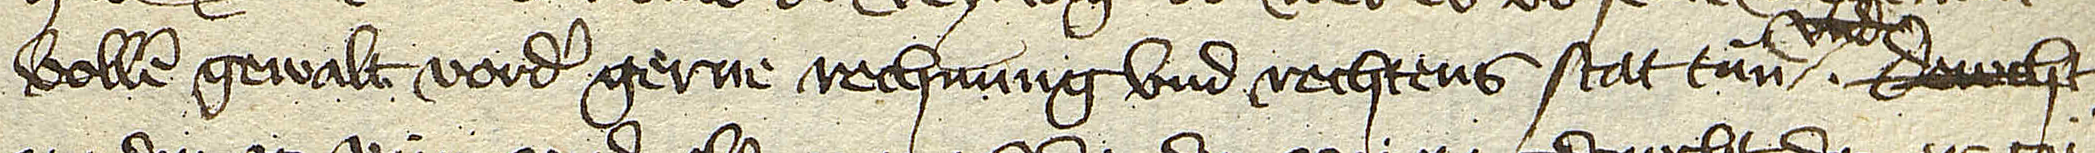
volle* gewalt vord* gerne rechnung vnd rechtens ſtat tün / . Dewcht
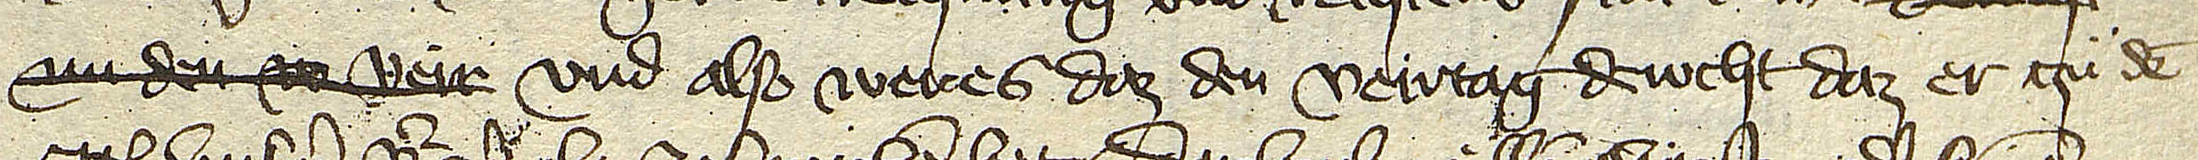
nu den w veir vnd alſo weres daʒ den veirtag dewcht daʒ er cʒü de*
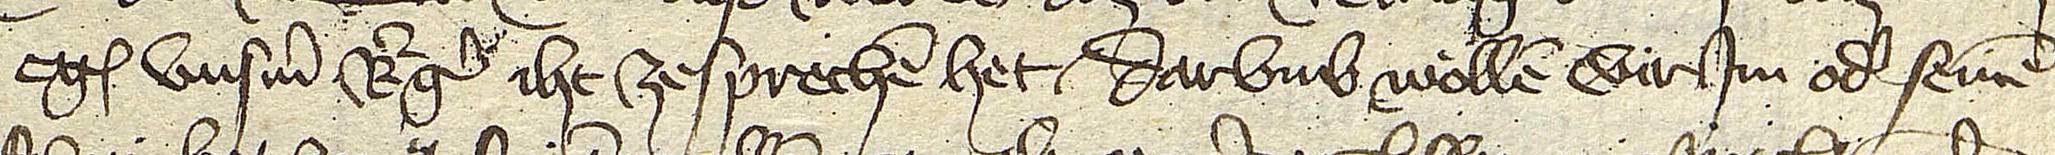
eg* vnſm* B*g* iht cʒeſpreche* het / darvmb wölle* wir Im od* ſeine*
